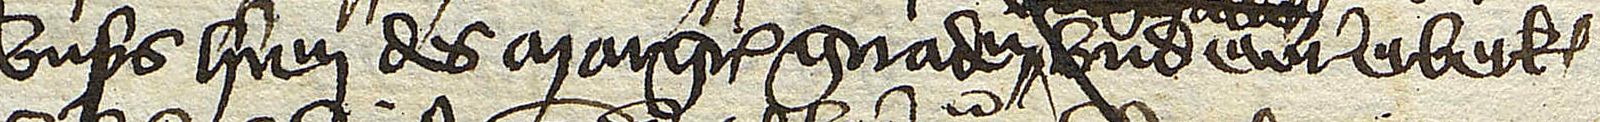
vnſ*s h*ren des Margr* gnad*n vnd ewr* erberk*
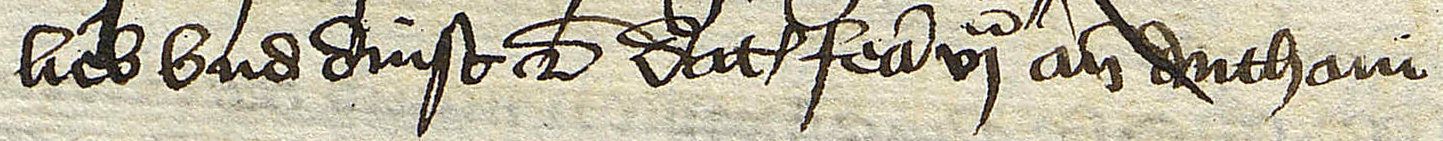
lieb vnd dinſt ec* Dat* f*ia vi* an* Anthoni
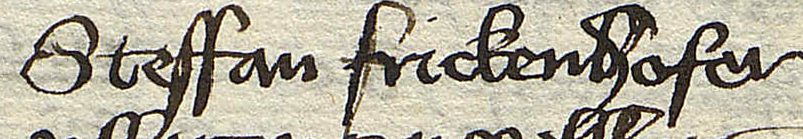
Steffan frickenhofer
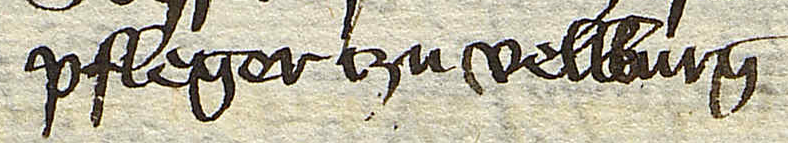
pfleger cʒu velburg
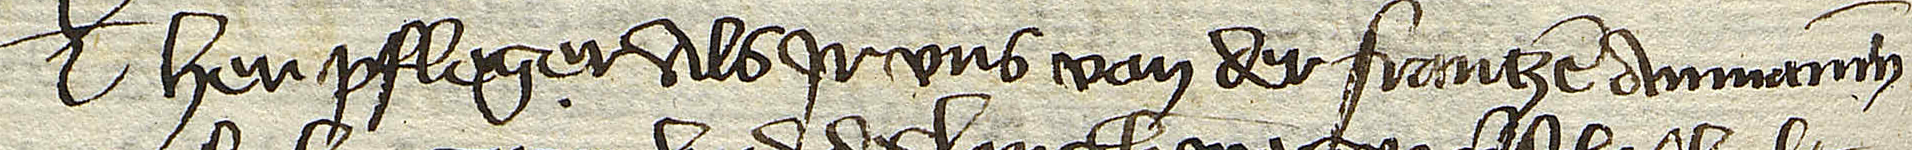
L* her pfleger Als Ir vns von der francʒe Ammanin*
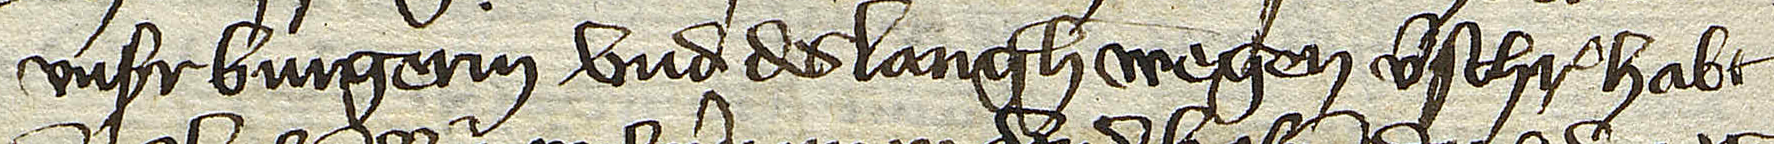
vnſ*r burgerin vnd des langh* wegen v*ſchr* habt
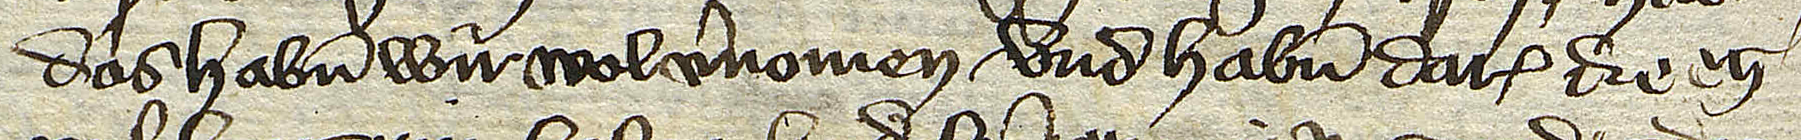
das hab* wir wol v*nomen Vnd hab*n dar* die eg*
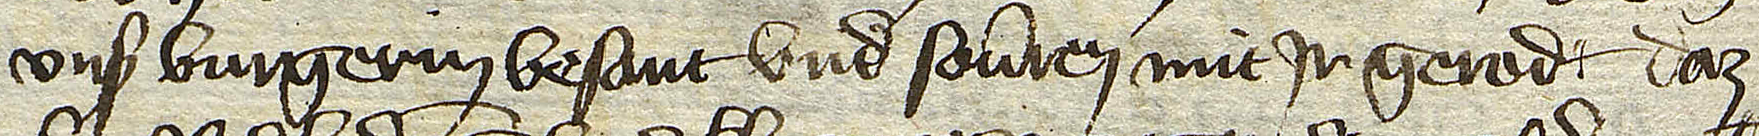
vnſ* burgerin beſant vnd ſou*ren mit Ir geredt daʒ
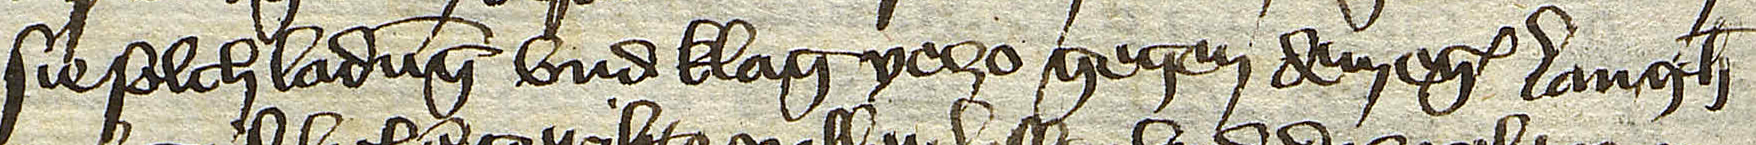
ſie ſolch ladug* vnd klag yecʒo gegen dem eg* langh*
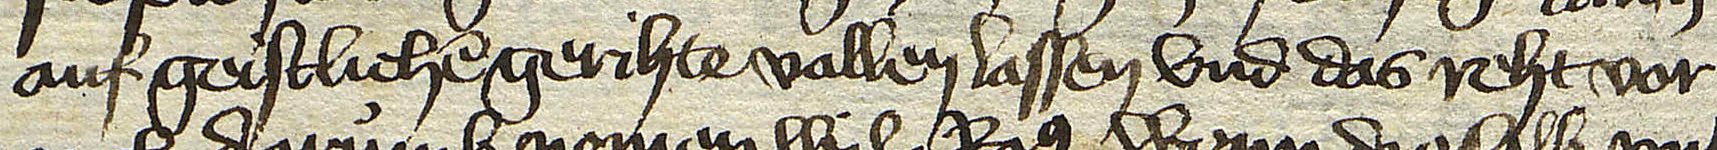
auf geiſtliche* gerihte vollen laſſen vnd das reht vor
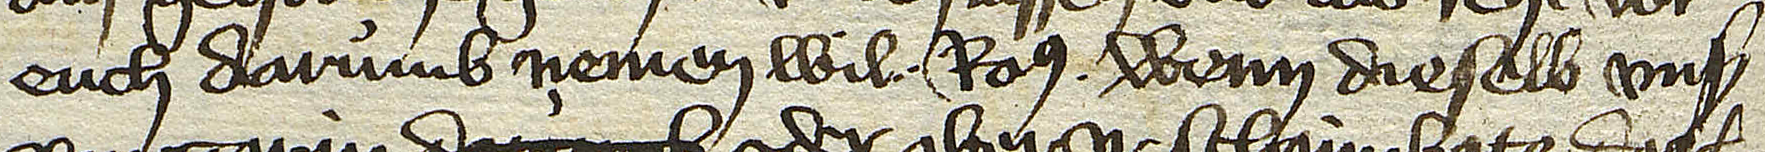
euch darümb nemen wil . Ro* . Wenn dieſelb vnſ*
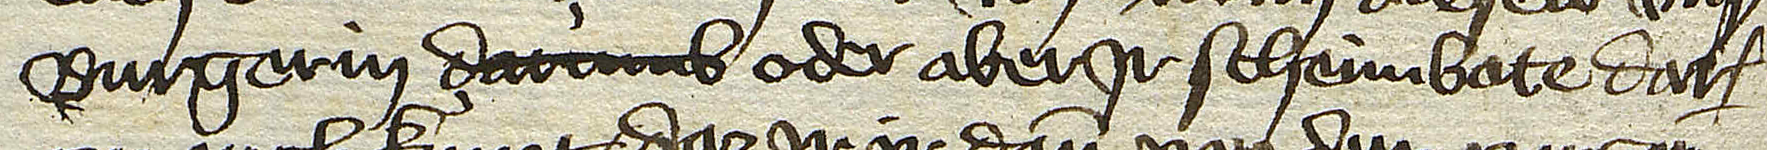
Burgerin darümb oder aber Ir ſcheimbote dar*
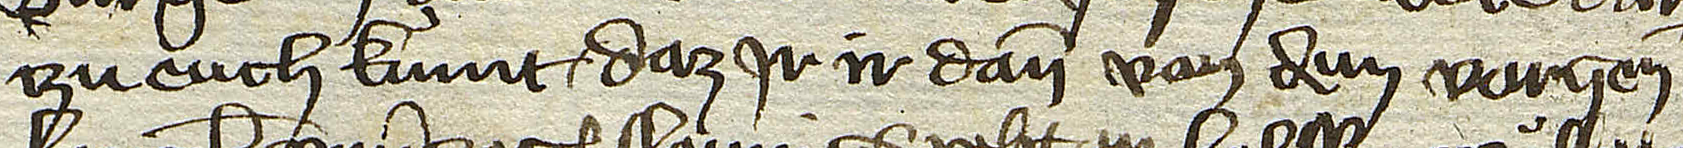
cʒu euch kümt / daʒ Ir ir dan* von dem vorgen*
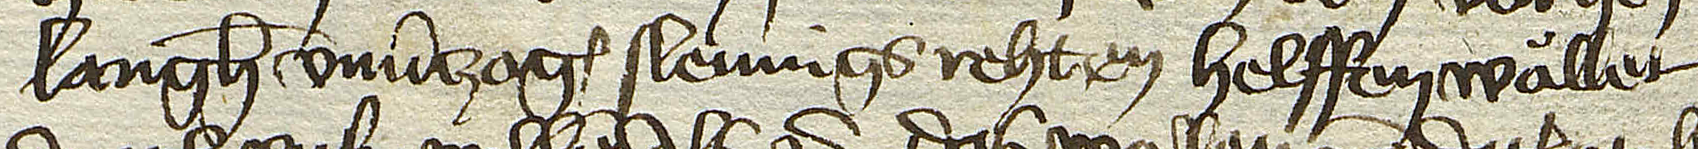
langh* vnu*cʒog* ſleunigs rehten helffen wöllet
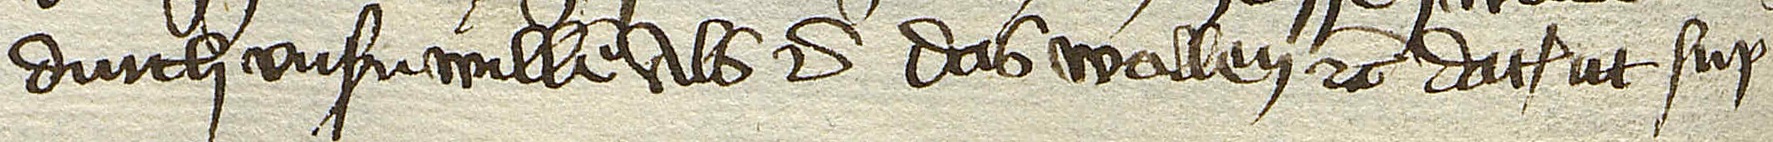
durch vnſ*n wille* Als ec* . das wollen ec* Dat* ut ſup*
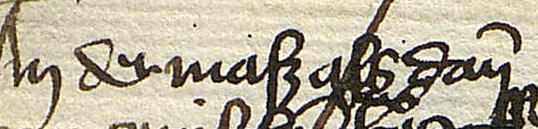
in der maſʒ als dan*
